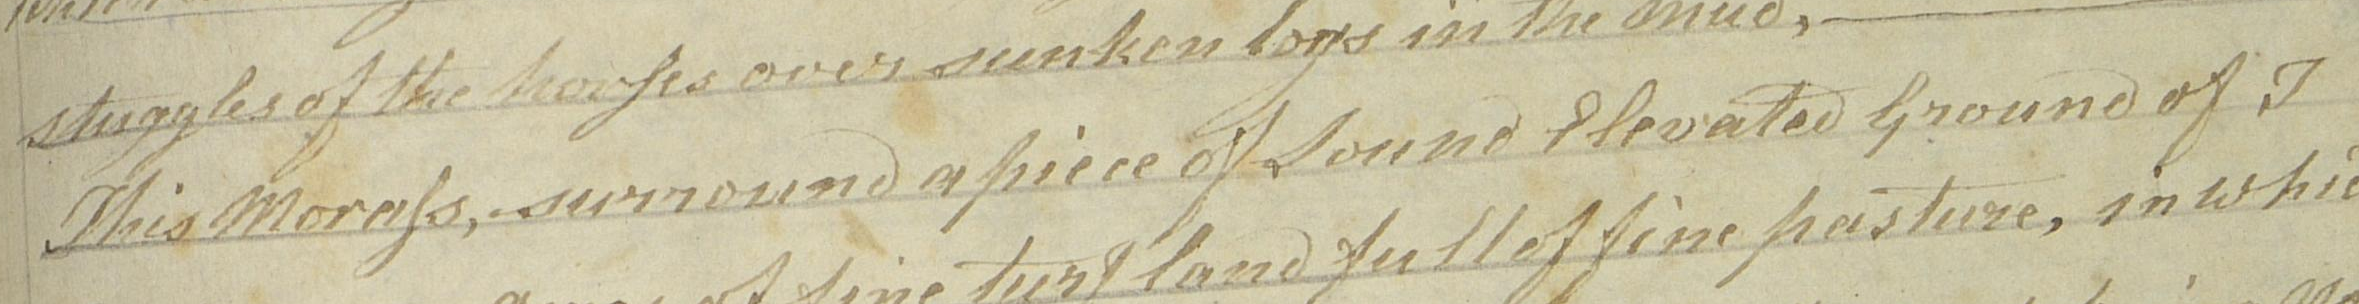This Morass, surround a piece of Sound Elevated Ground of I
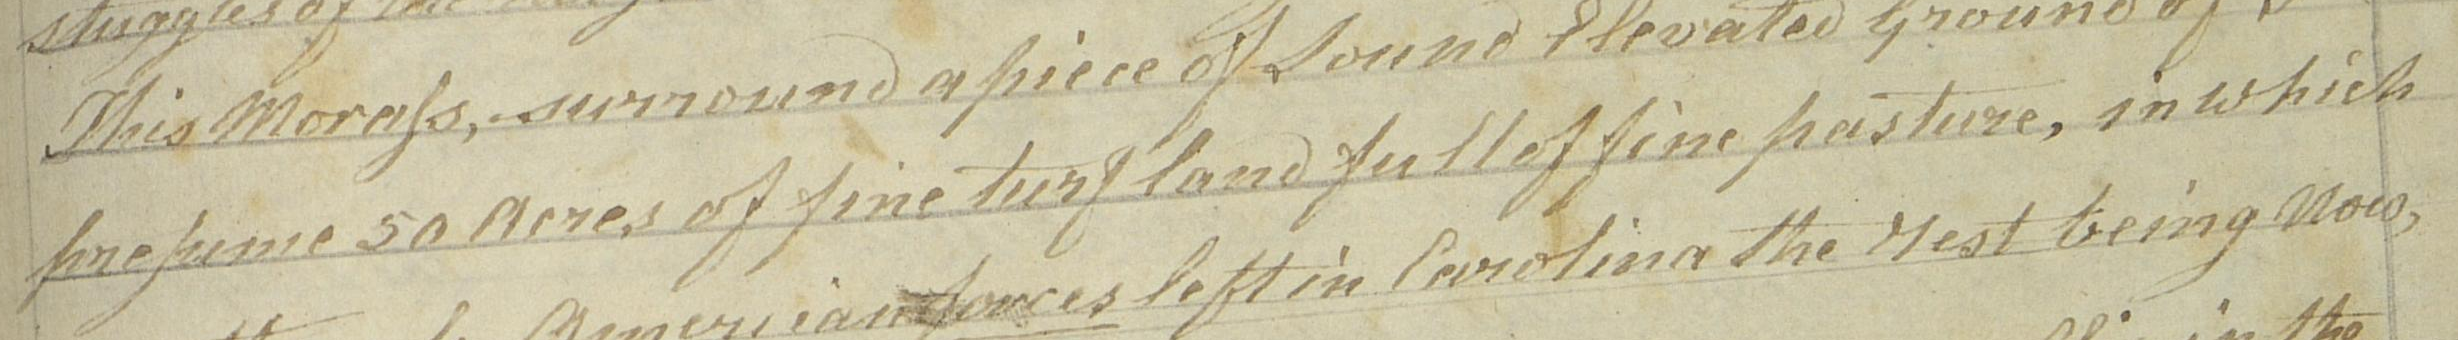presume 50 acres of fine turf land full of fine pasture, in which
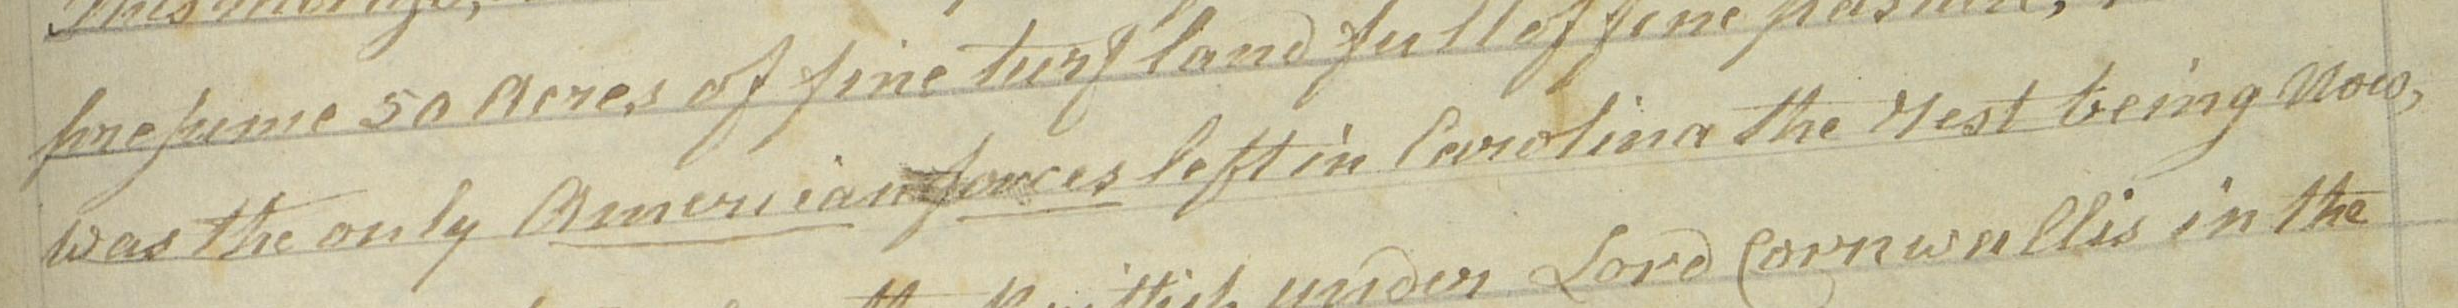was the only American forces left in Carolina the rest being Now,
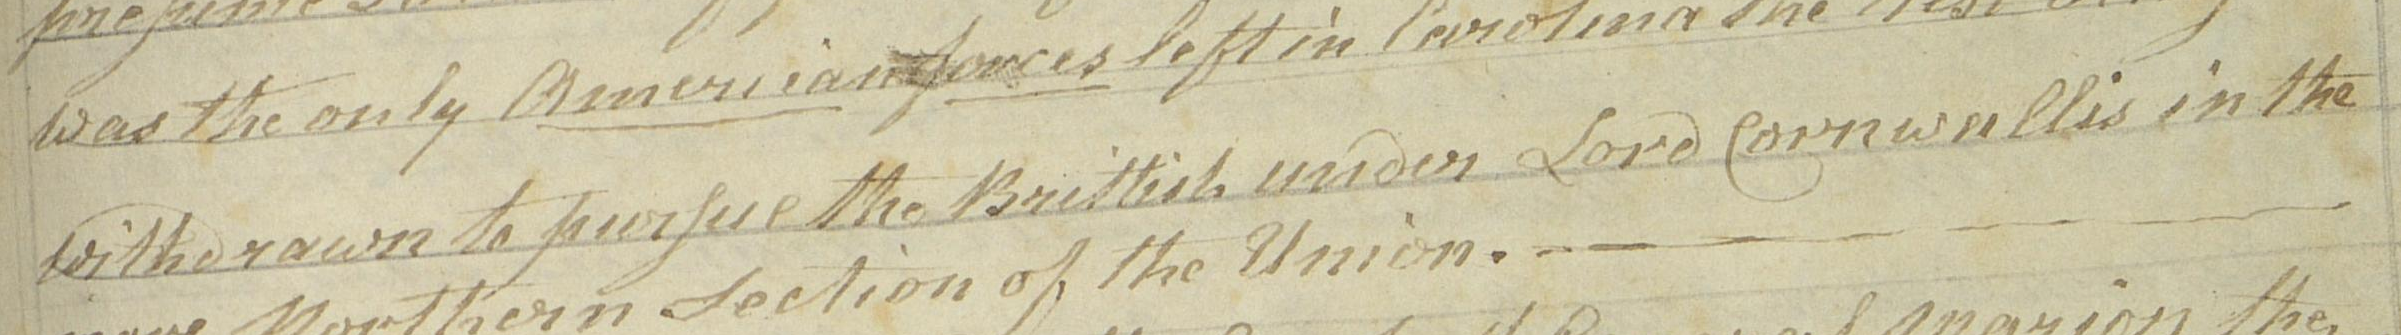withdrawn to pursue the Brittish under Lord Cornwallis in the
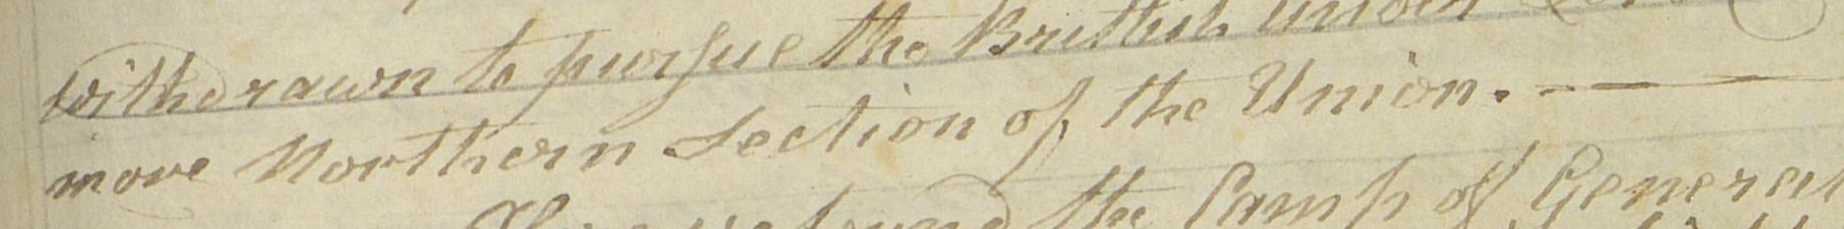move Northern Section of the Union.
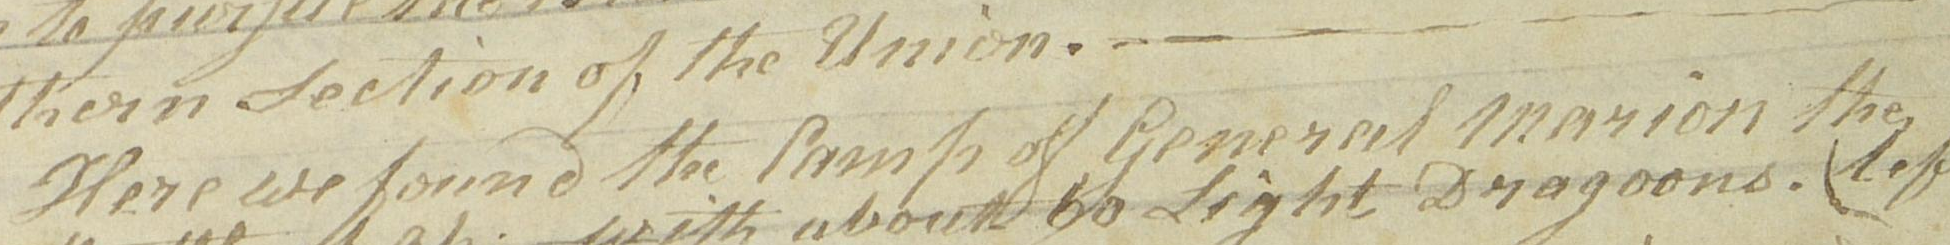Here we found the Camp of General Marion the
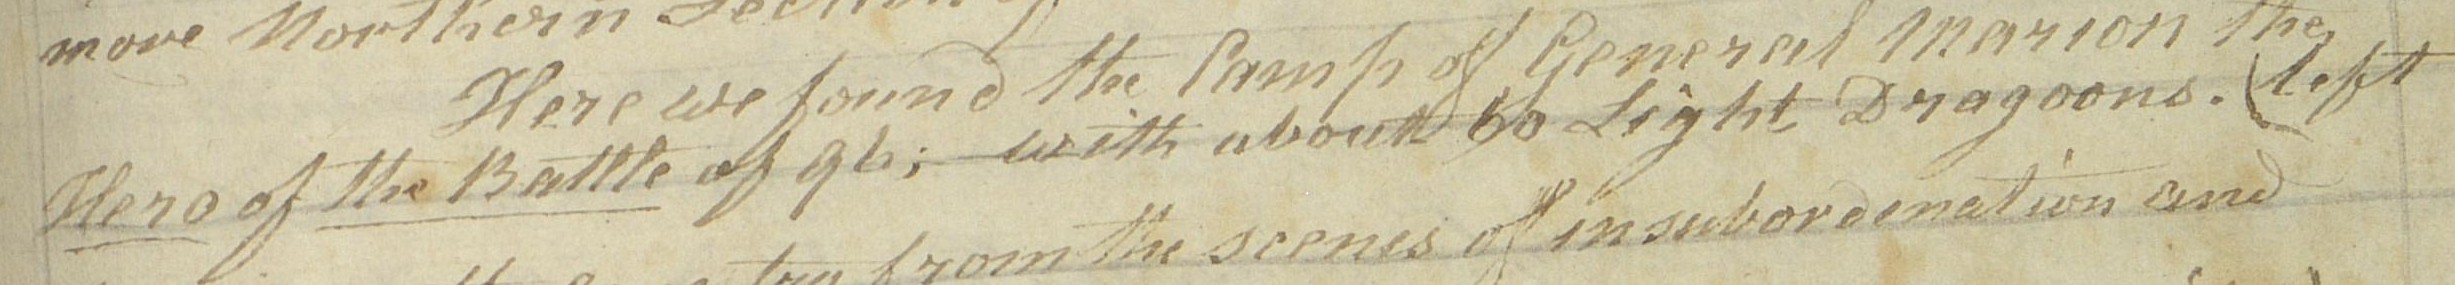Hero of the Battle of 96; with about 60 Light Dragoons. (left
